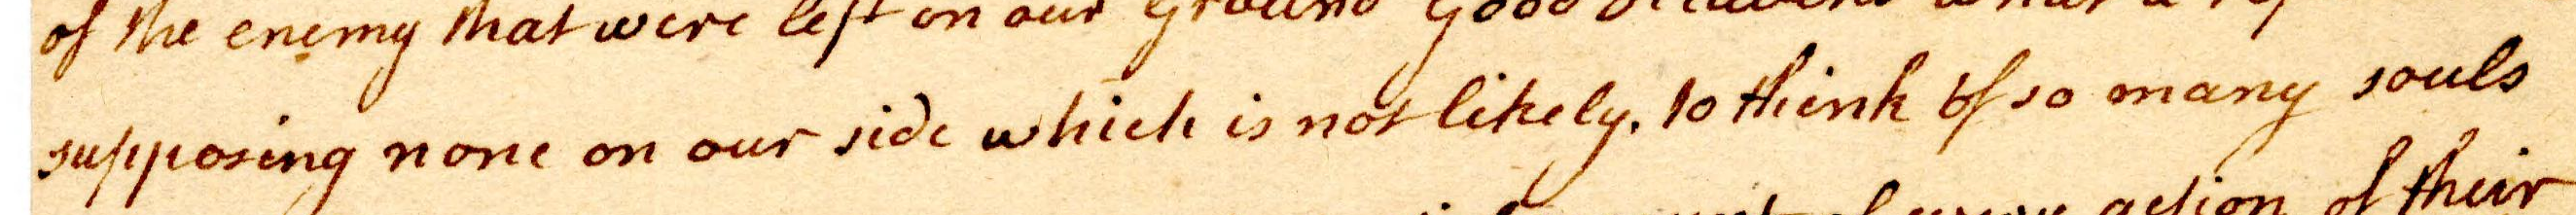supposing none on our side which is not likely, to think of so many souls
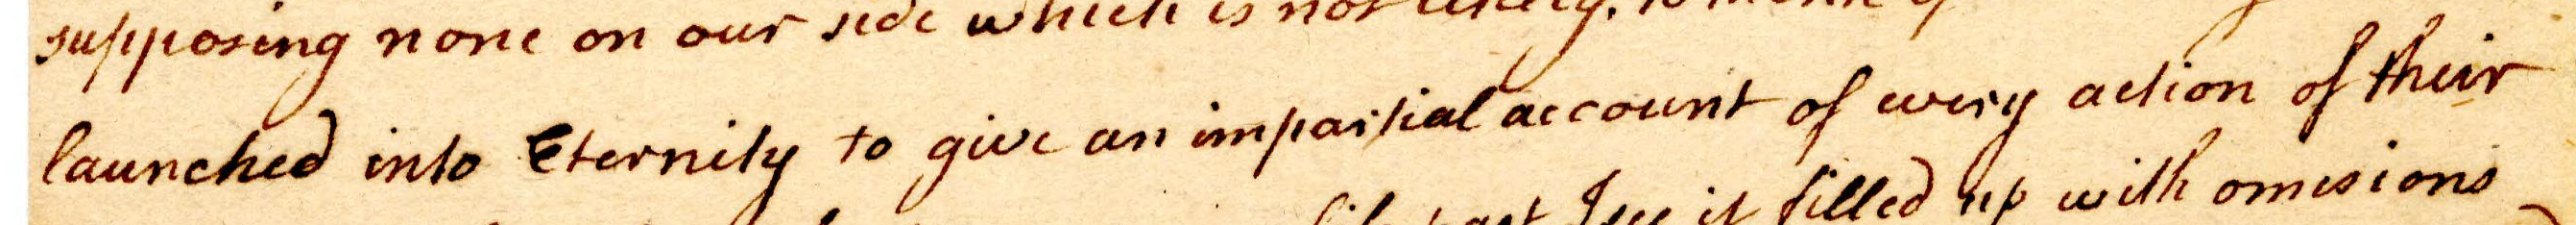launched into eternity to give an impartial account of every action of their
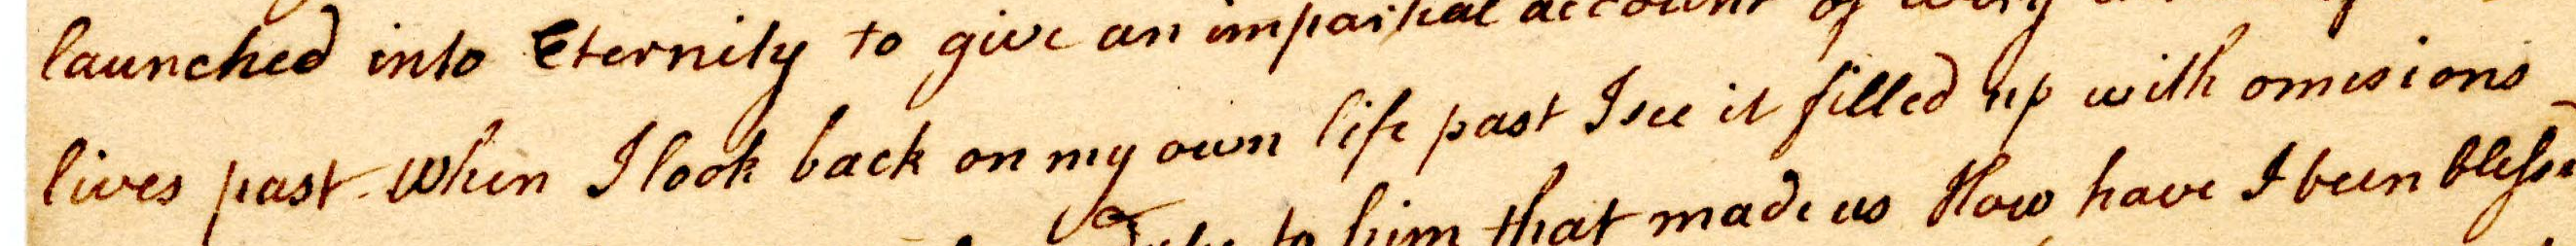lives past when I look back on my own life past I see it filled up with omisions
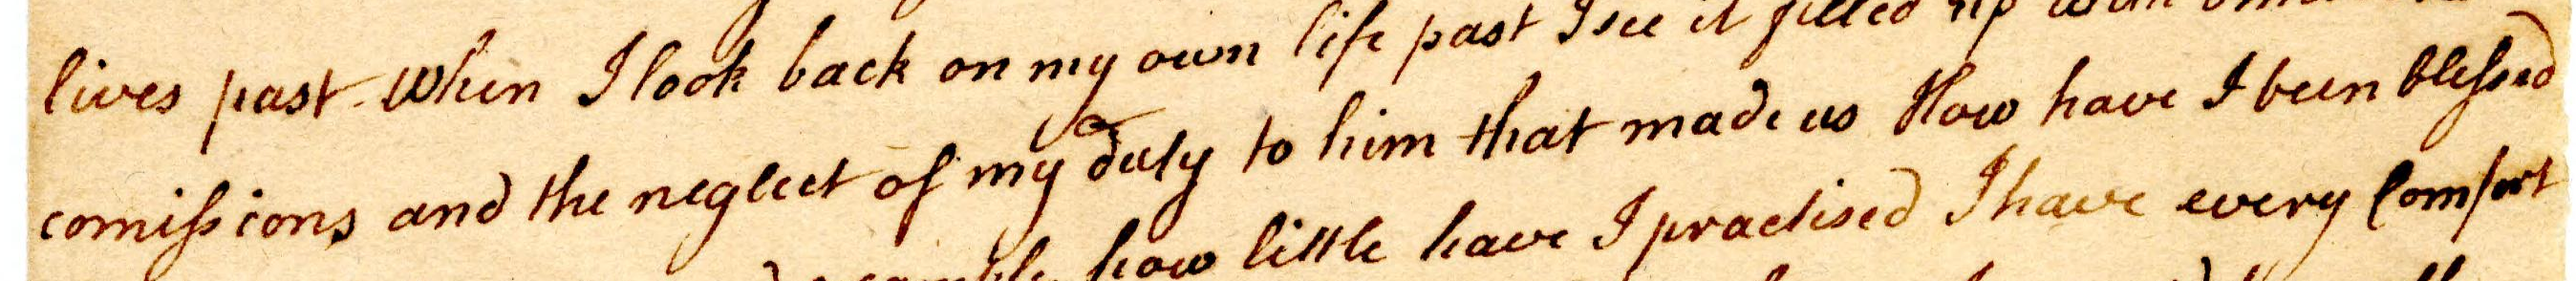comissions and the neglect of my duty to him that made us How have I been blessed
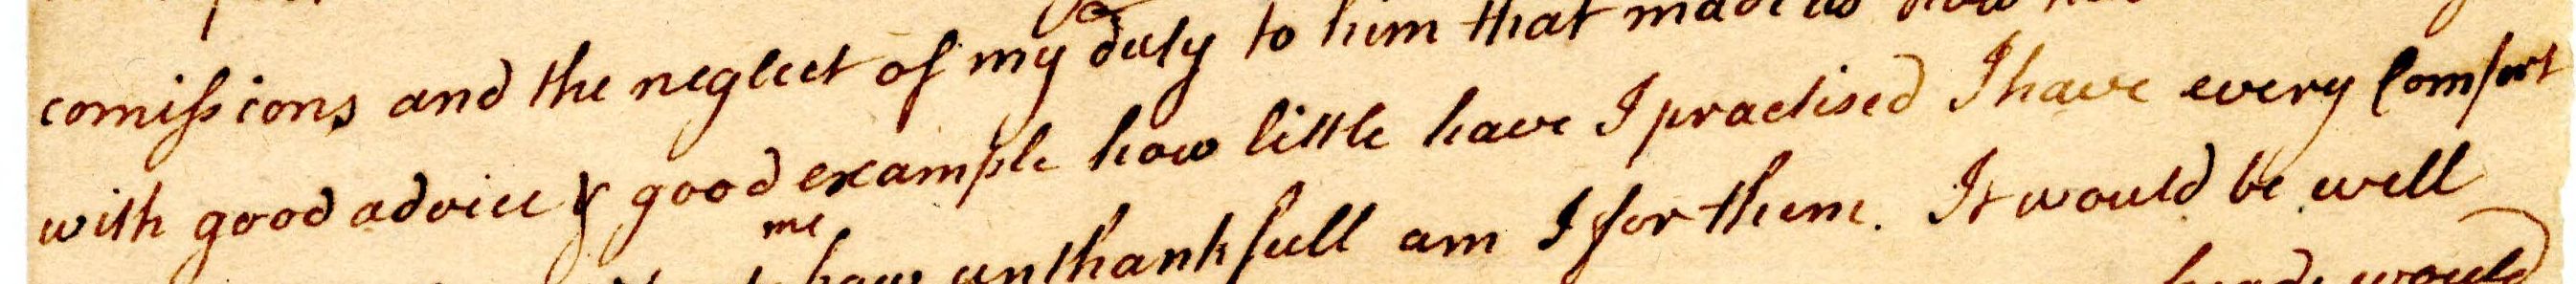with good advice & good example how little have I practised I have every Comfort
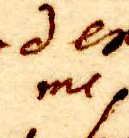me
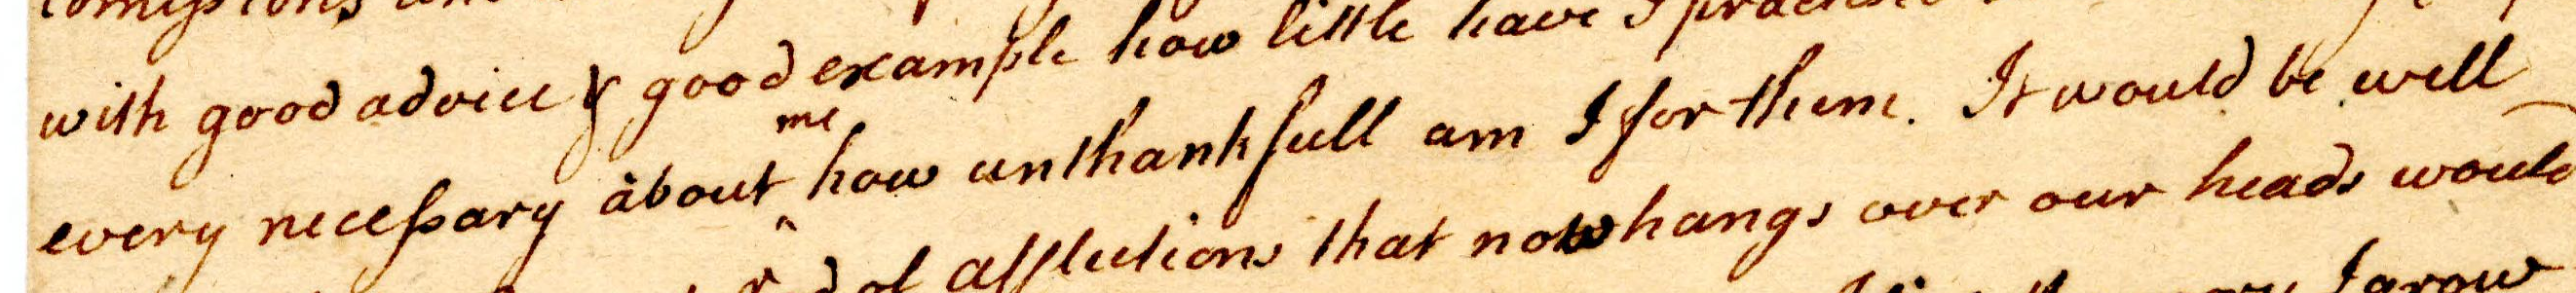every necessary about ^ how unthankfull am I for them. It would be well
